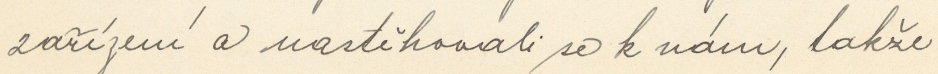zařízení a nastěhovali se k nám, takže
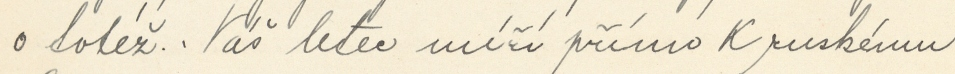o totéž. Náš letec míří přímo k ruskému
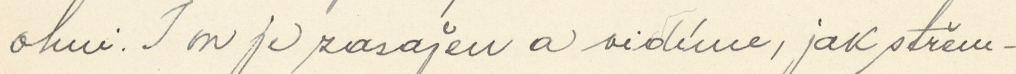ohni. I on je zasažen a vidíme, jak střem-
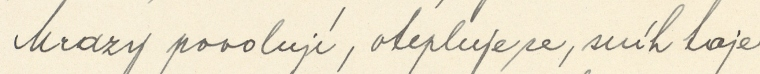Mrazy povolují, otepluje se, sníh taje
